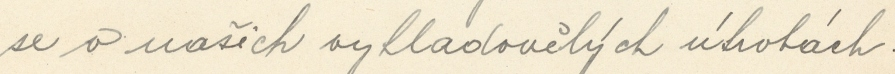se v našich vyhladovělých útrobách.
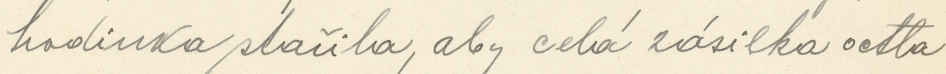hodinka stačila, aby celá zásilka octla
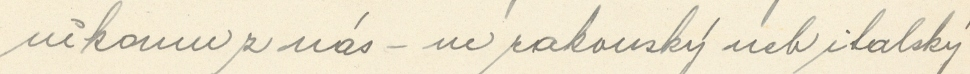někomu z nás - ne rakouský neb italský
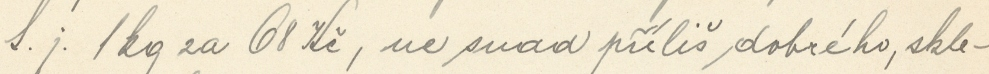t. j. 1 kg za 68 Kč, ne snad příliš dobrého, skle-
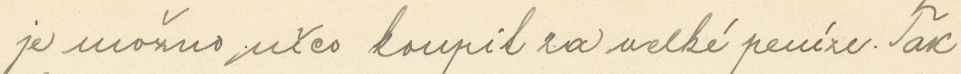je možno něco koupit za velké peníze. Tak
